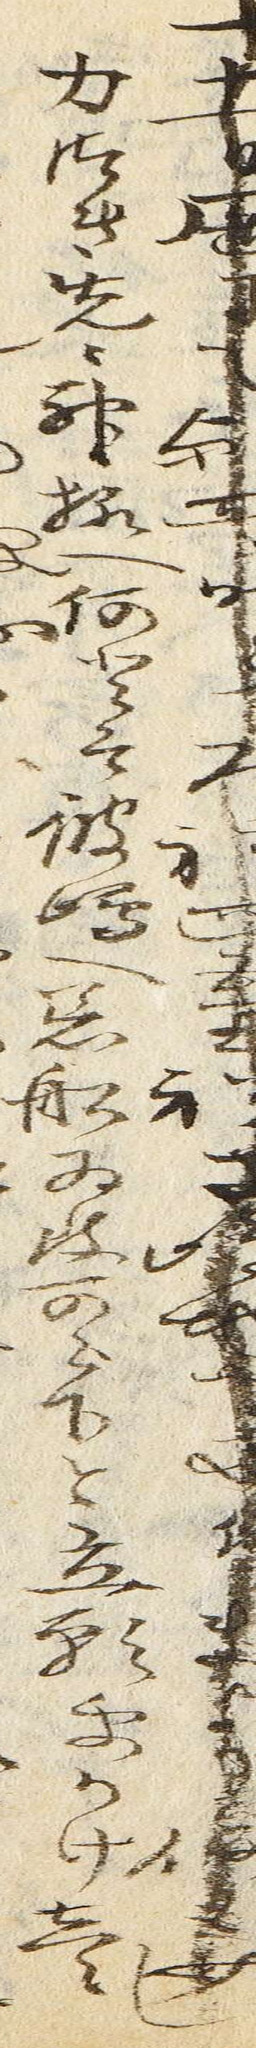力つき先々神様へ何とそ彼嶋へ着船為致可被下と立願をかけ壱
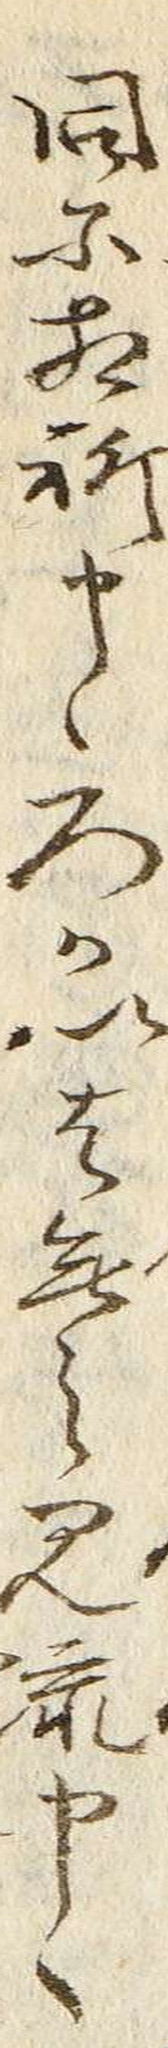同に相祈申候ろかいは無之見流申候
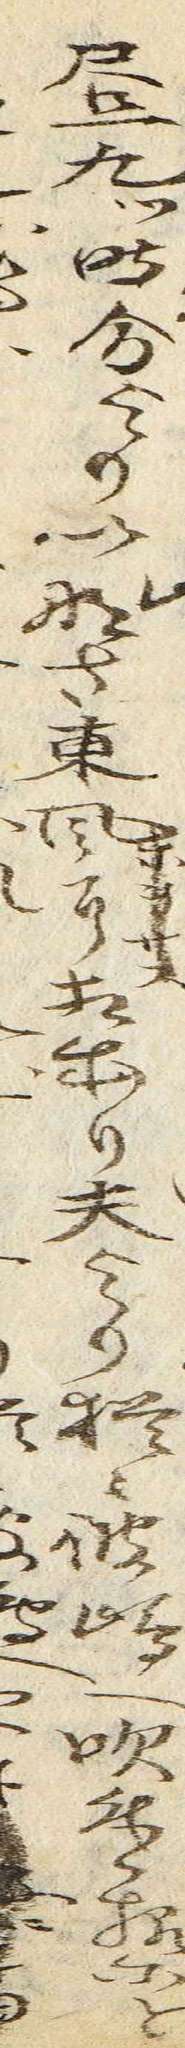昼九ツ時分よりいなさ東風に相成り夫より猶々彼嶋へ吹付候様にと
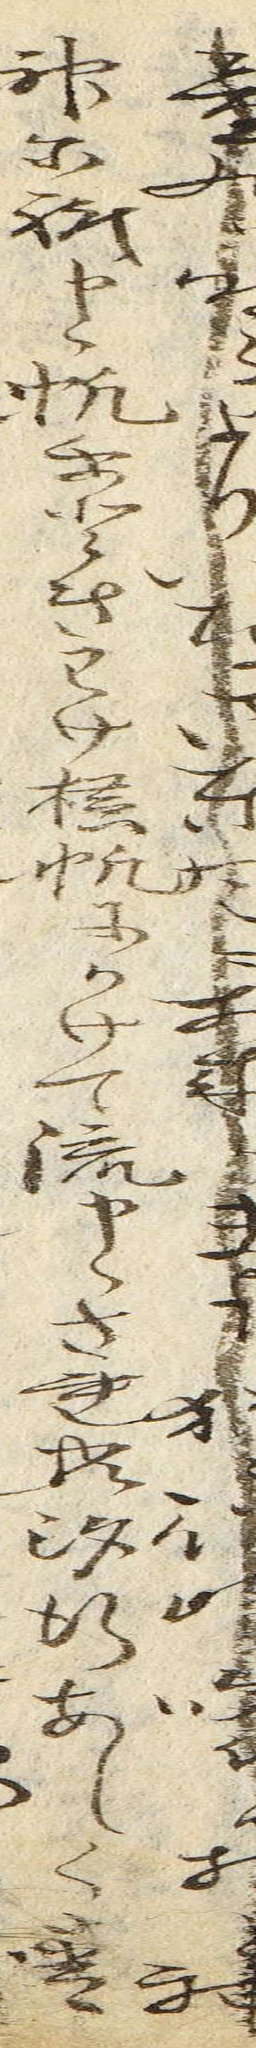神に祈申候帆をときわけ横帆にかけて流申候され共汐行あしく御座候
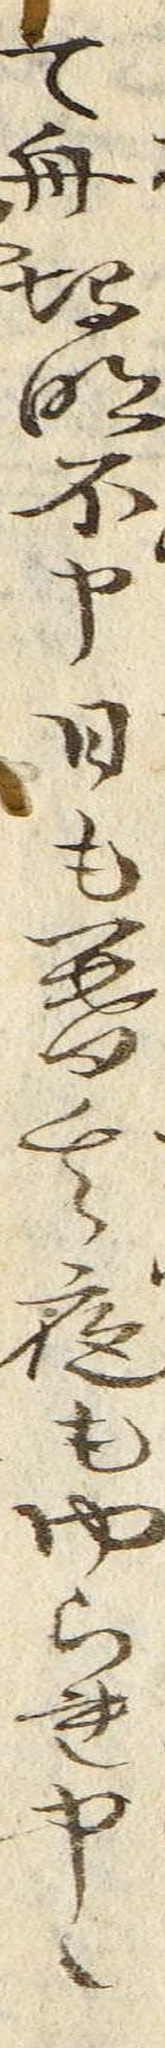て舟埒明不申日も暮其夜もゆられ申候
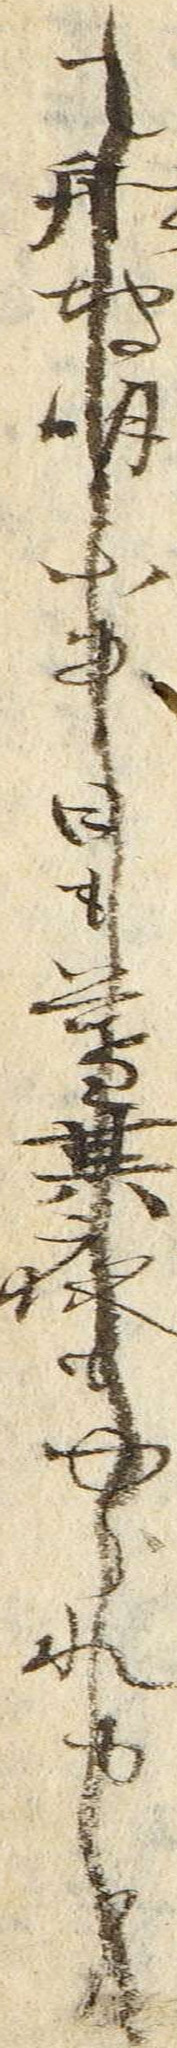て舟埒明不申日も暮其夜もゆられ申候

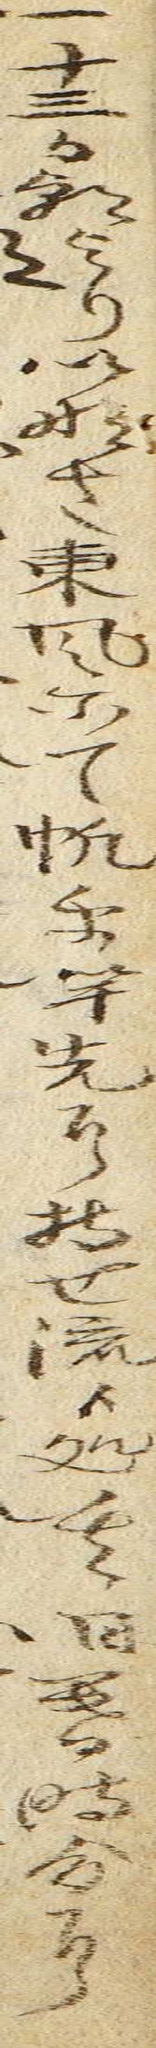一十三日朝よりいなさ東風にて帆を竿先に持せ流候処其日暮時分に
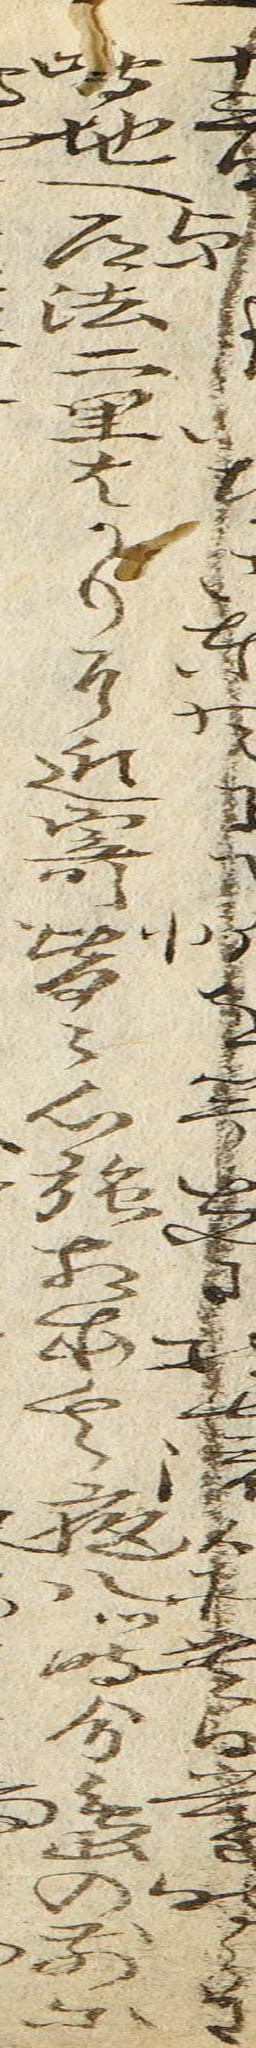嶋地へ道法二里はかりに近寄皆々心強く相成其夜八ツ時分嶋の前に
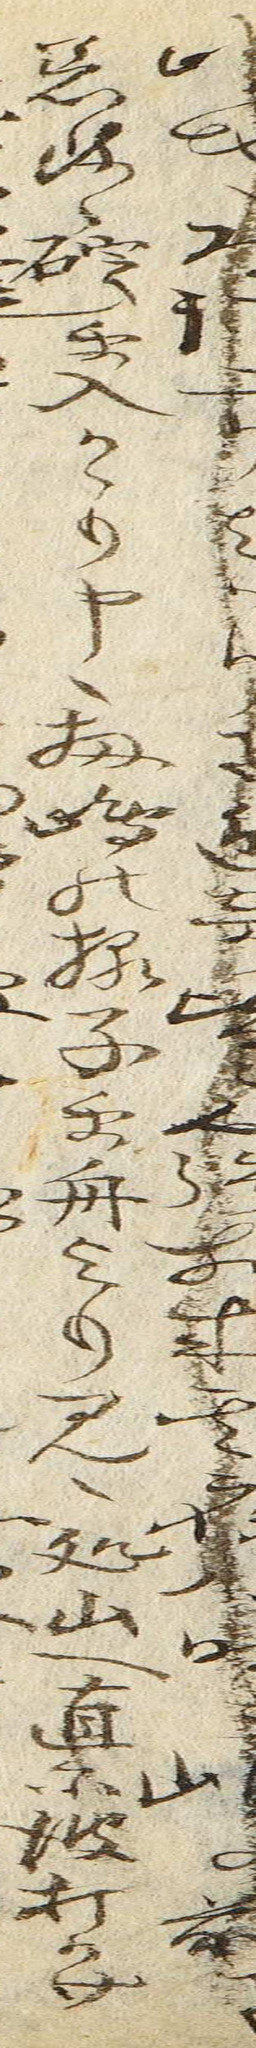着致候碇を入かゝり申候扨嶋の様子を舟より見候処山へ直に波打かけ
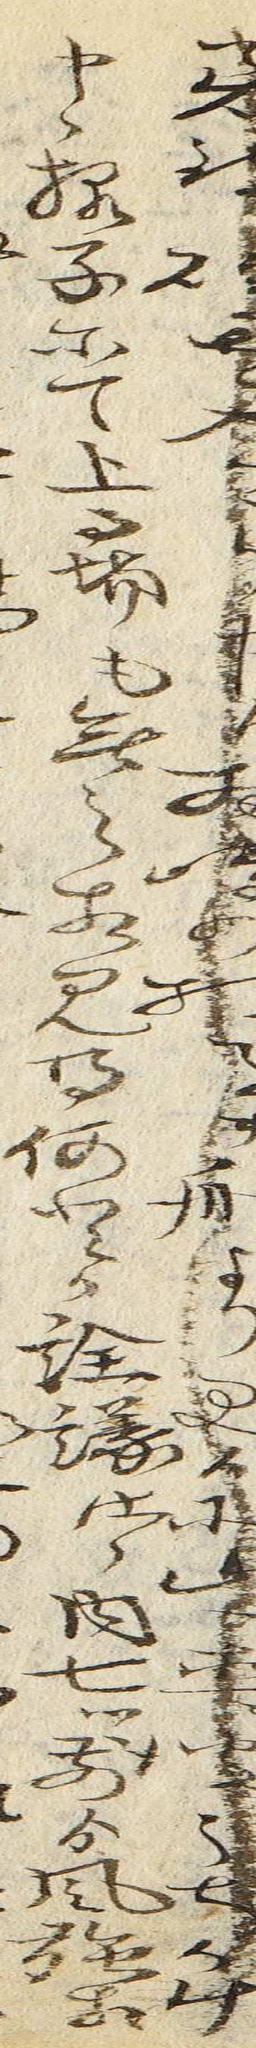申候様子にて上る場も無之相見得何とか詮議仕候内七ツ前ゟ風強相
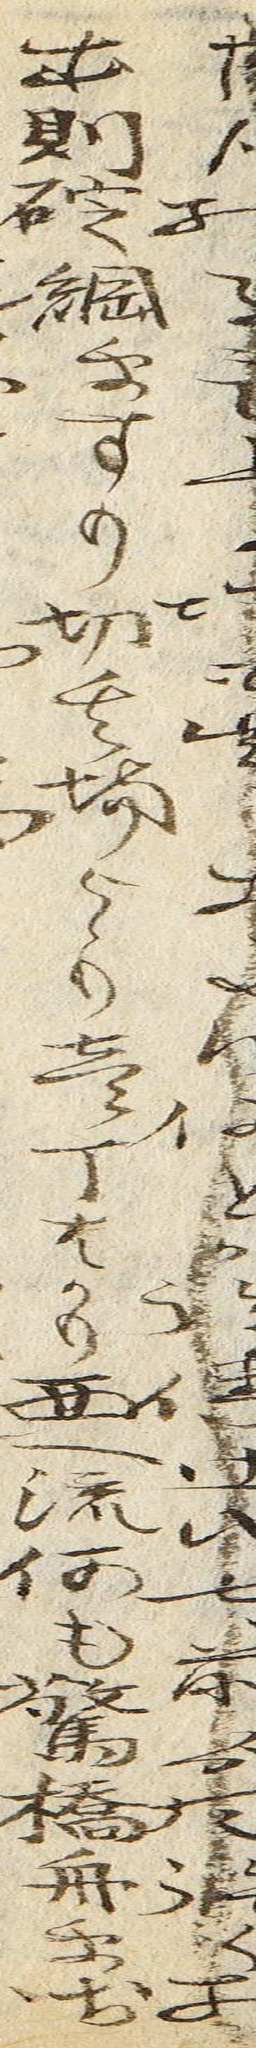成則碇網をすり切其場より壱丁はかりに西へ流何も驚橋舟をお
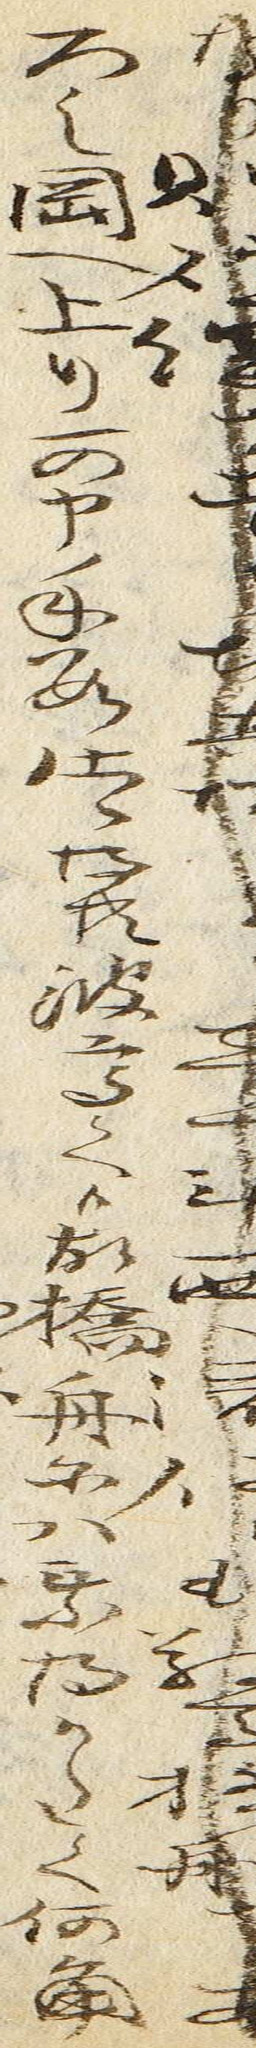ろし岡へ上り可申手段仕候得共波高く候故橋舟ハ乗得かたく何角
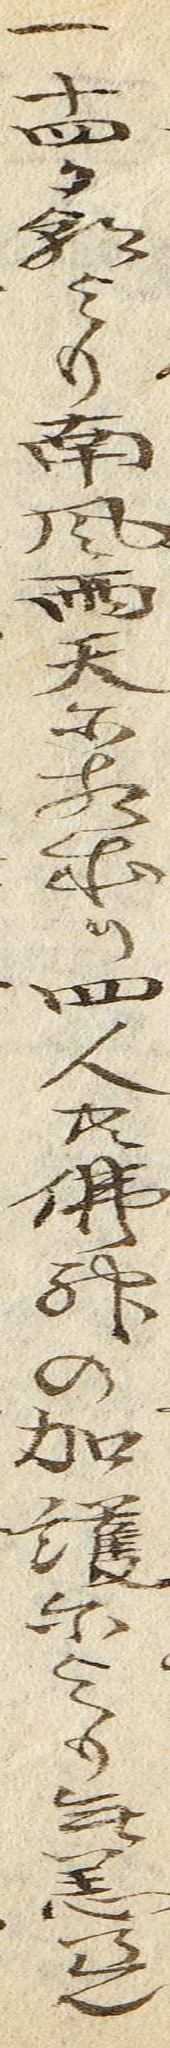一十四日朝より南風雨天に相成り四人共仏神の加護により無恙着
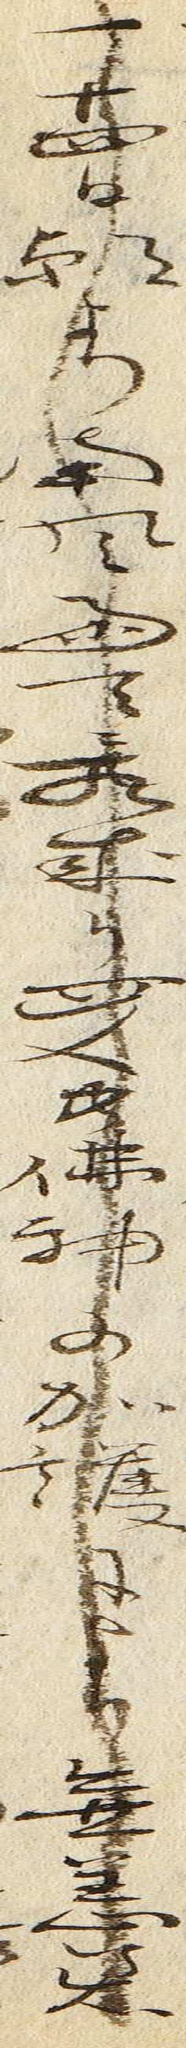一十四日朝より南風雨天に相成り四人共仏神の加護により無恙着
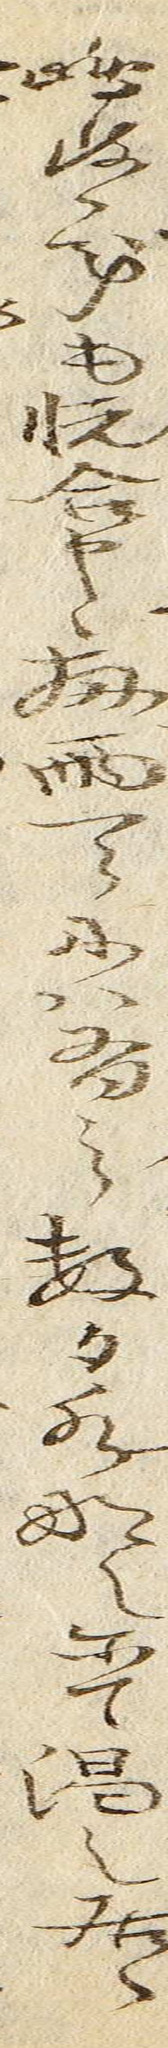嶋致候義も悦合申候扨雨天にハ有之数日水なしにて渇し居候
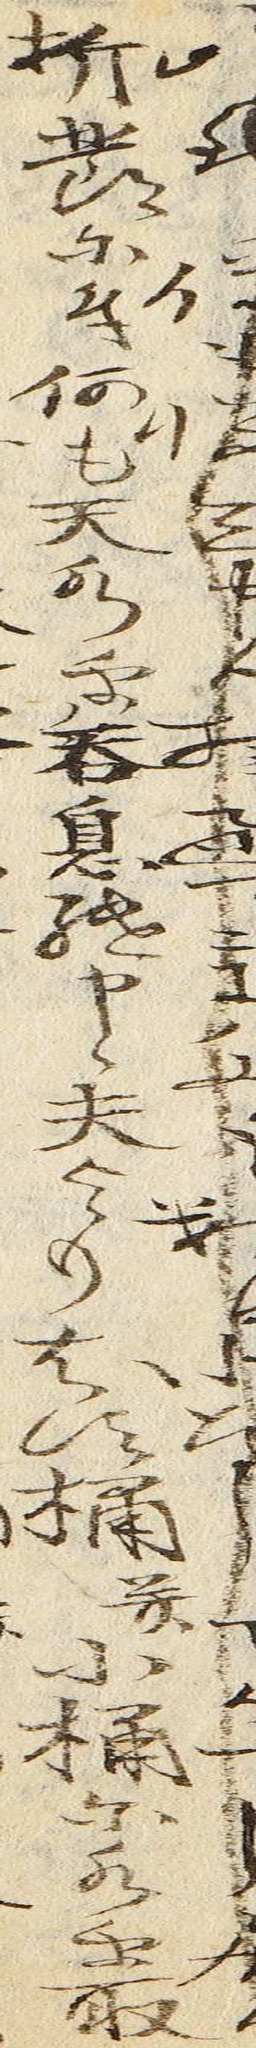折節に付何も天水を呑息継申候夫よりはす桶并小桶に水を取
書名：無人島漂流書付
